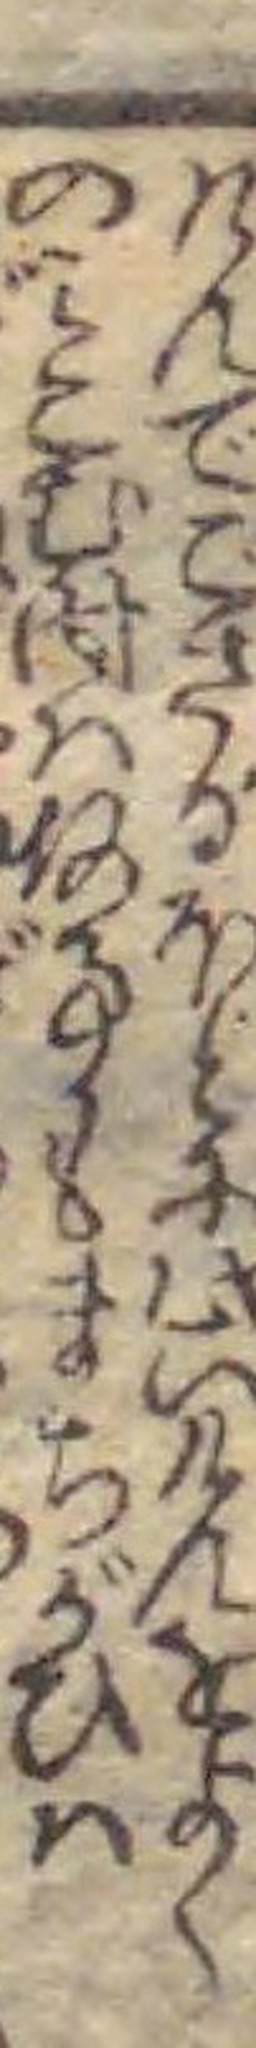のみこむ時は何事もまちがひは
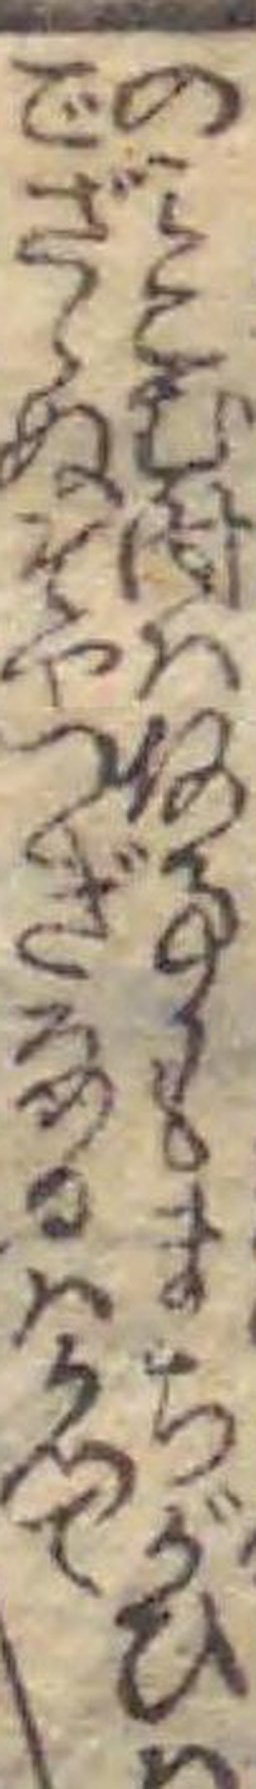ござらぬそやつぎなるはかつて
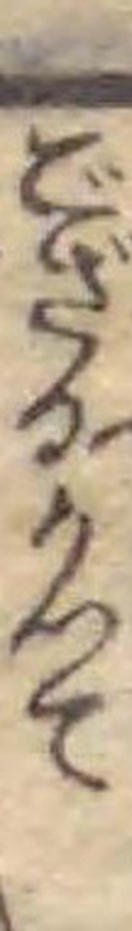ござるかつて
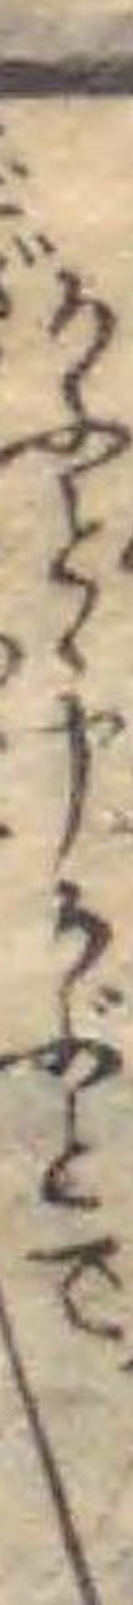かふとゝ申かぶとで
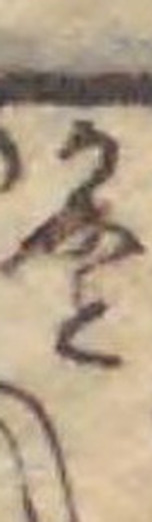かふと
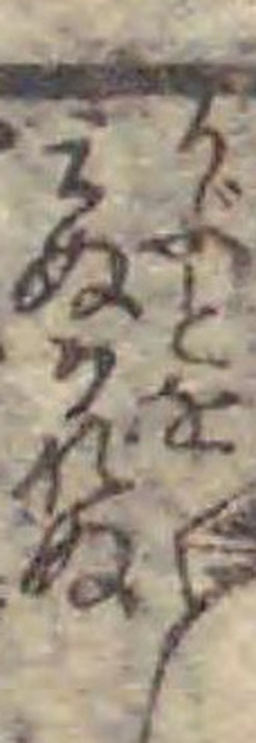みぬかれぬ
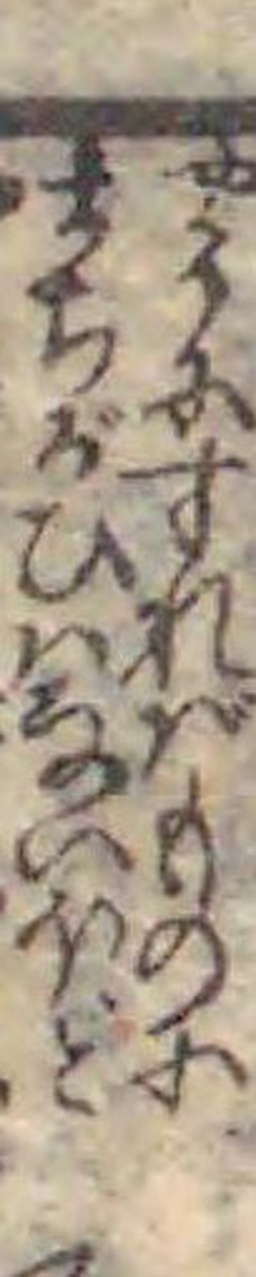まちがひはないほど
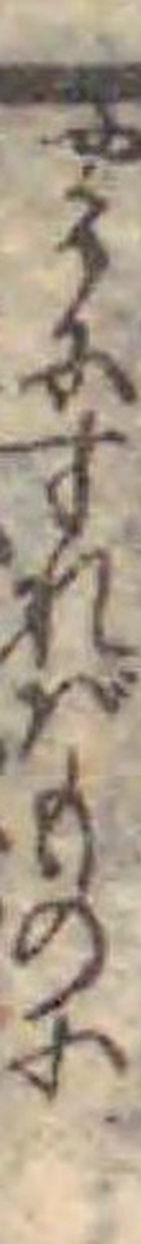やうにすればものに
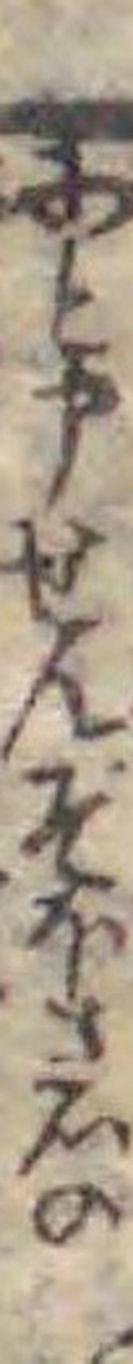にと申せんぞほさつの
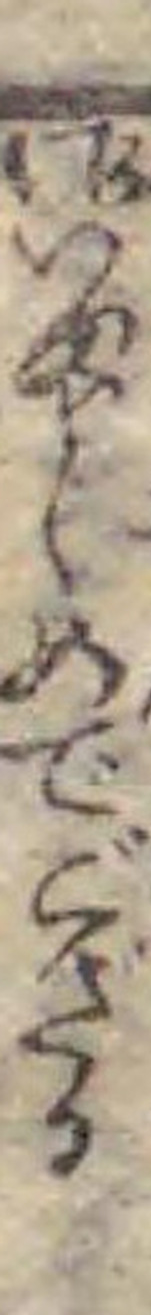御いましめでござる
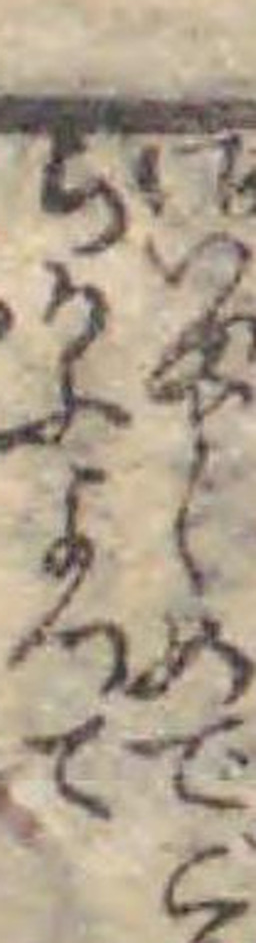ちかふよつて
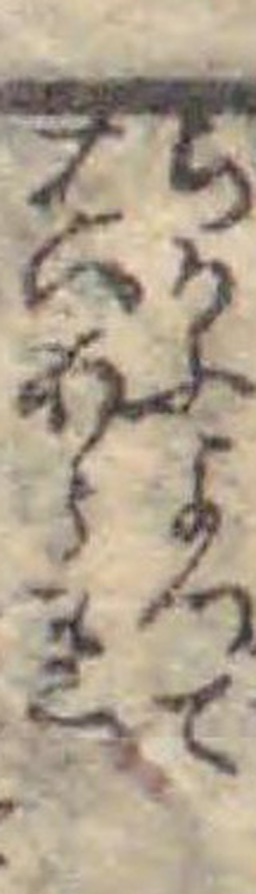はいあられ
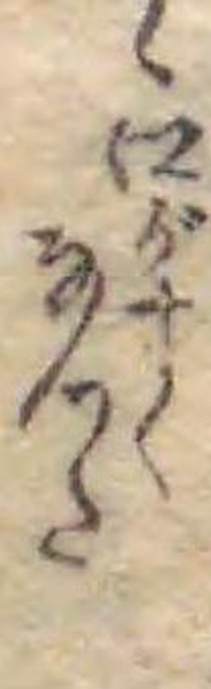なつた
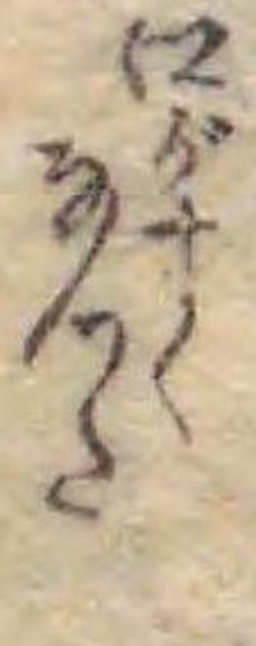なつた

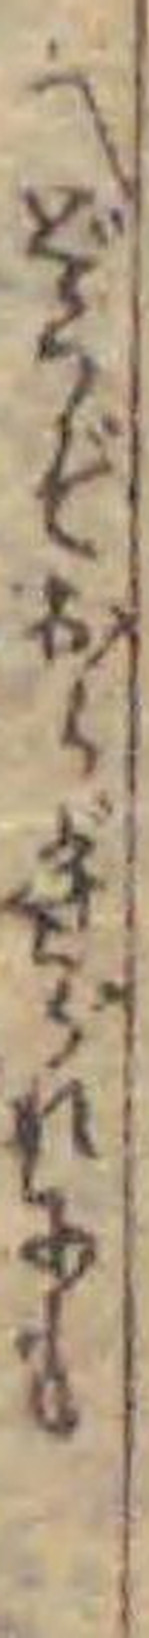〽どうぞおらがせがれにも
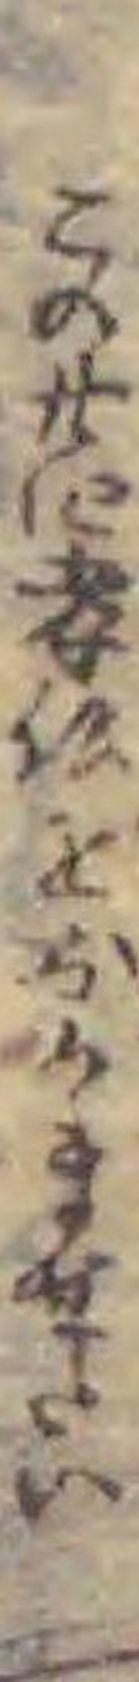この廿四孝仏をおかませたい
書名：身体開帳略縁起 : 3巻
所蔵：国立国会図書館 National Diet Library, JAPAN
